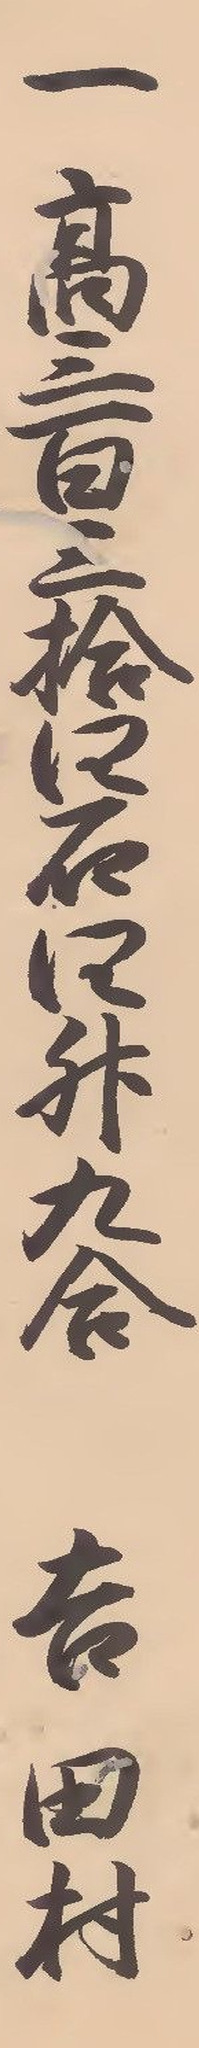一高三百三拾四石四升九合吉田村
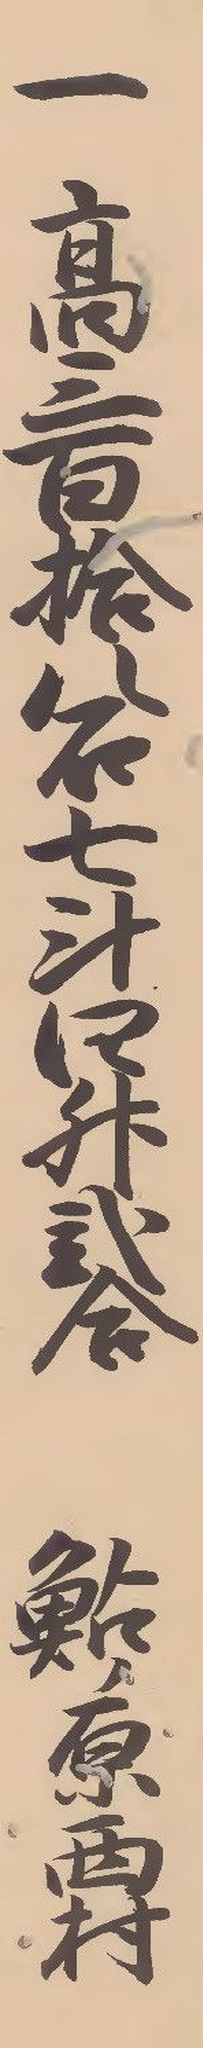一高三百拾八石七斗四升弐合鮎ノ原西村
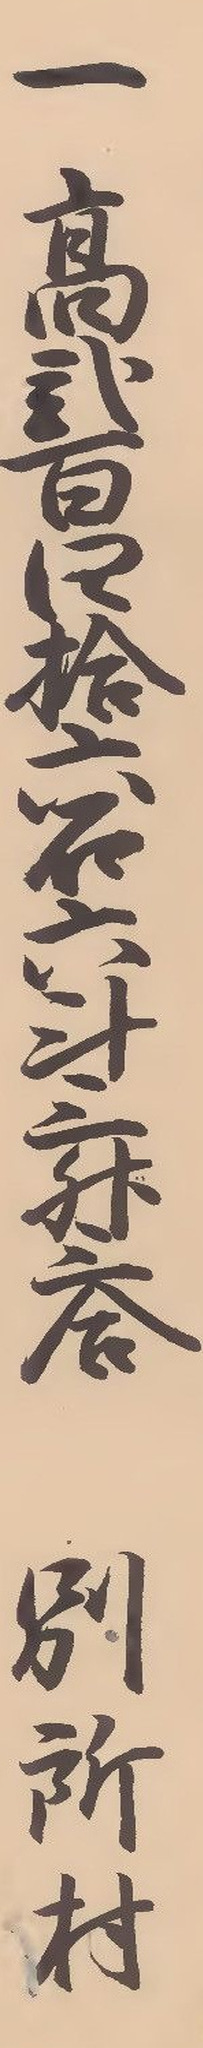一高弐百四拾六石六斗三升三合別所村
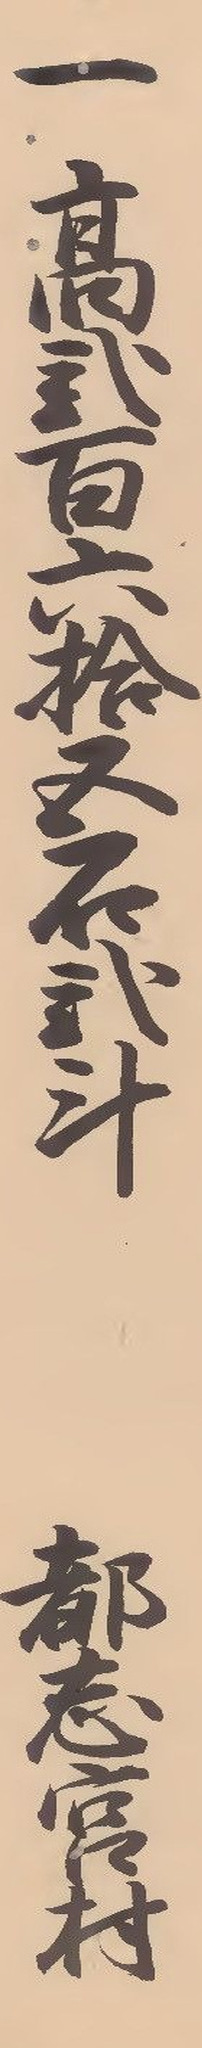一高弐百六拾五石弐斗都志宮村
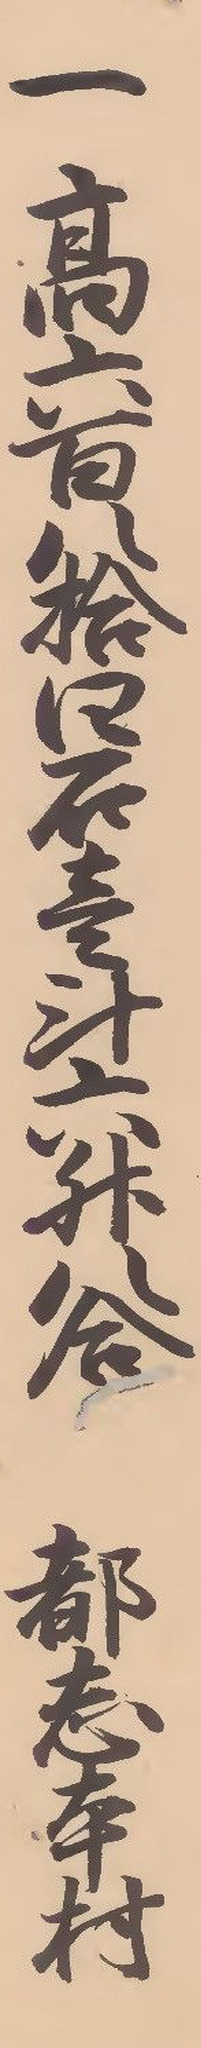一高六百八拾四石壱斗六升八合都志本村

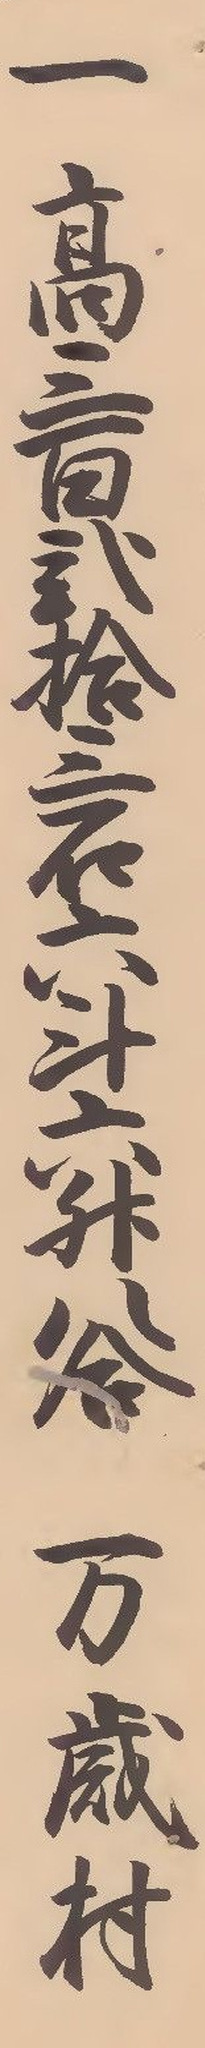一高三百弐拾三石六斗六升八合万歳村
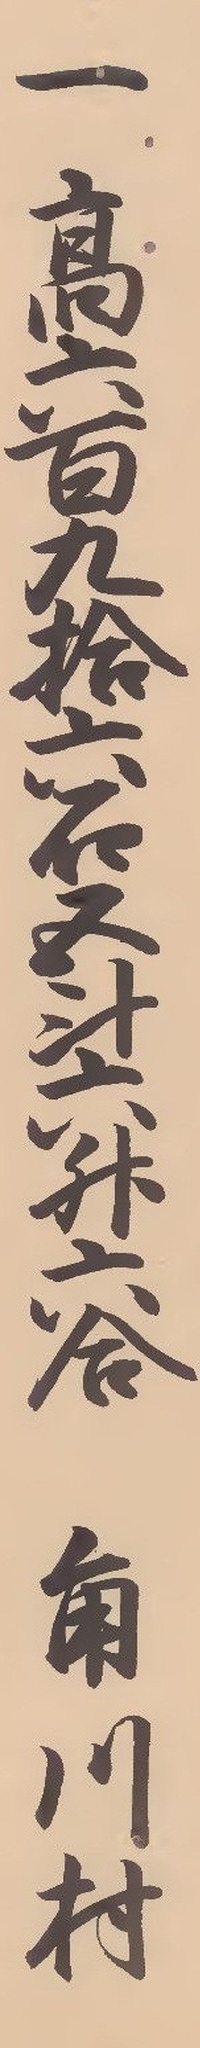一高六百九拾六石五斗六升六合角川村
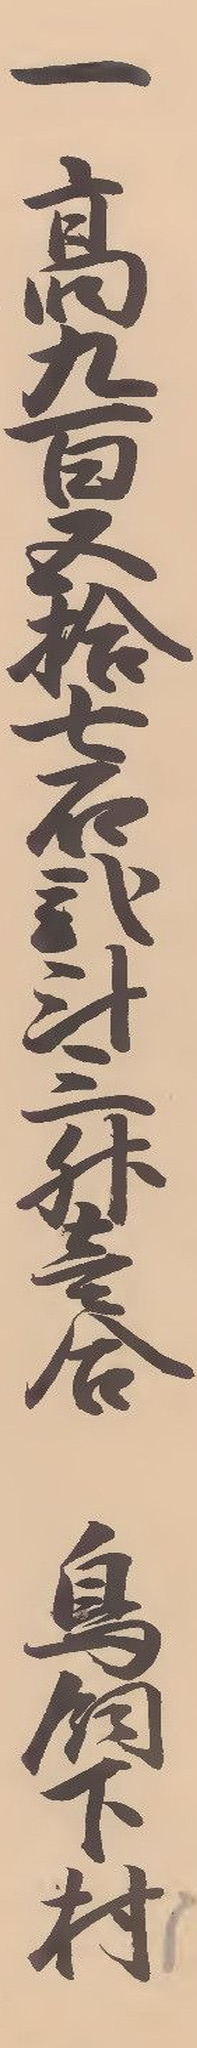一高九百五拾七石弐斗三升壱合鳥飼下村
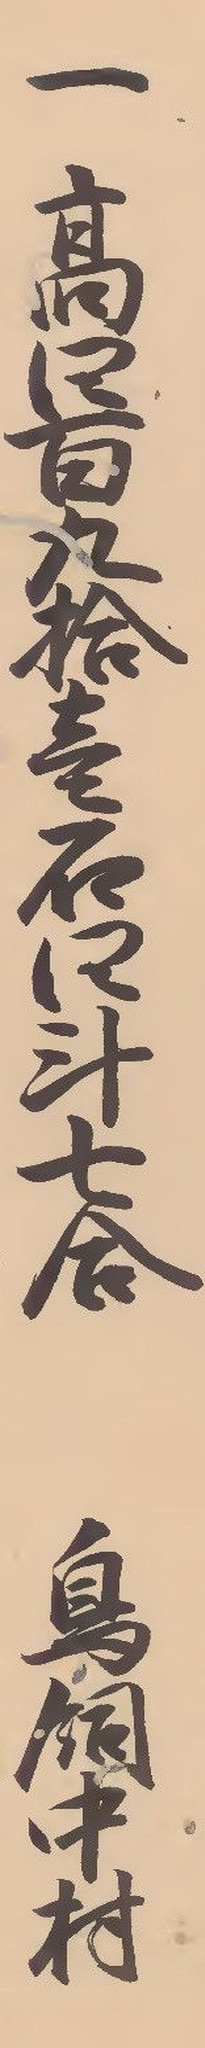一高四百九拾壱石四斗七合鳥飼中村
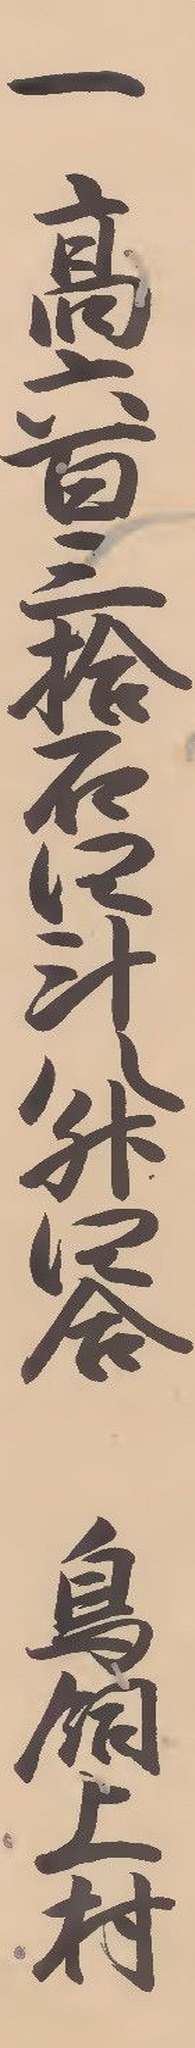一高六百三拾石四斗八升四合鳥飼上村
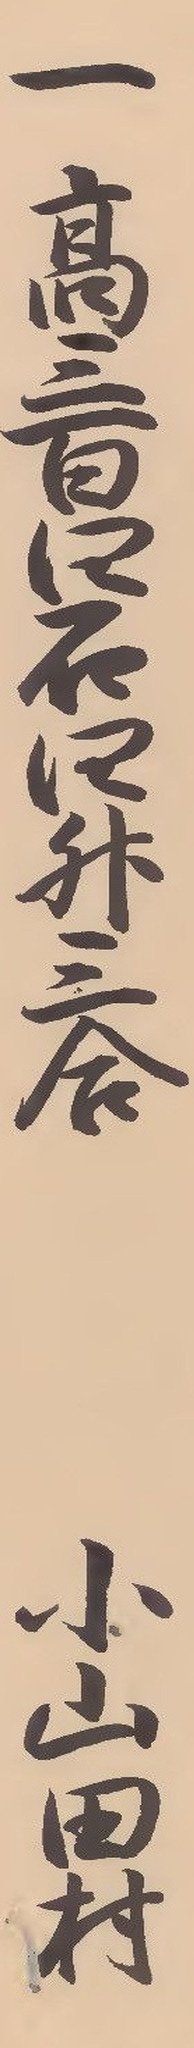一高三百四石四升三合小山田村
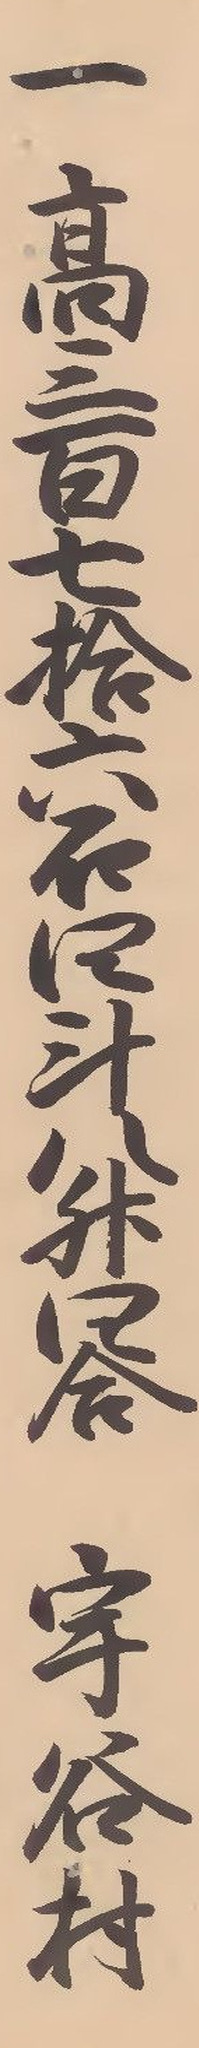一高三百七拾六石四斗八升四合宇谷村
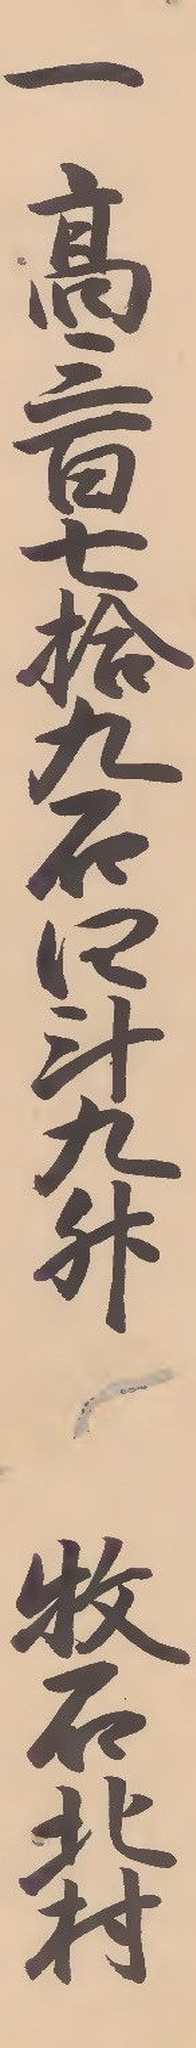一高三百七拾九石四斗九升牧石北村

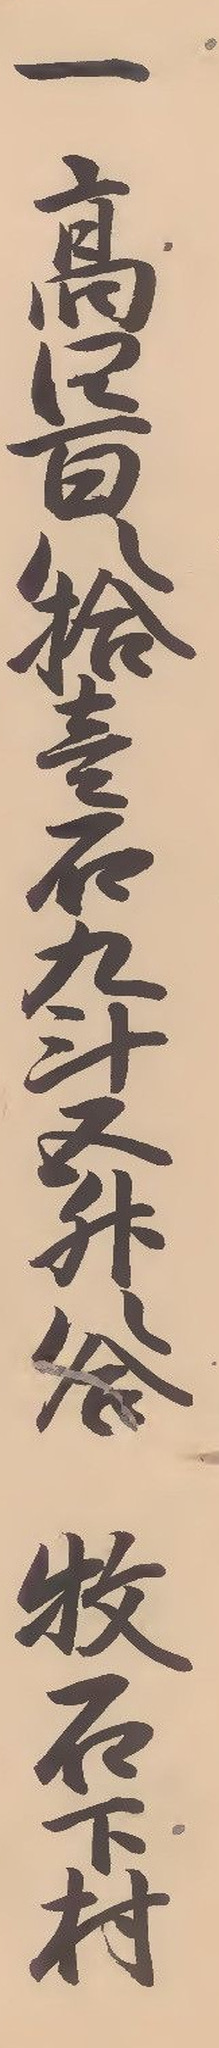一高四百八拾壱石九斗五升八合牧石下村
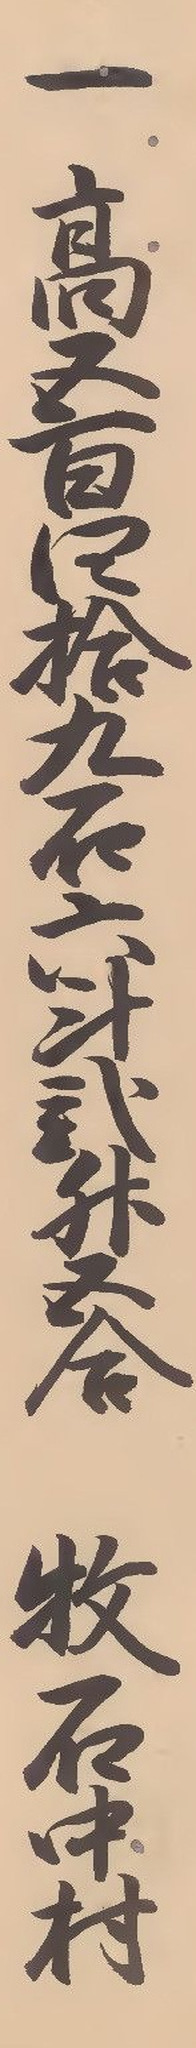一高五百四拾九石六斗弐升五合牧石中村
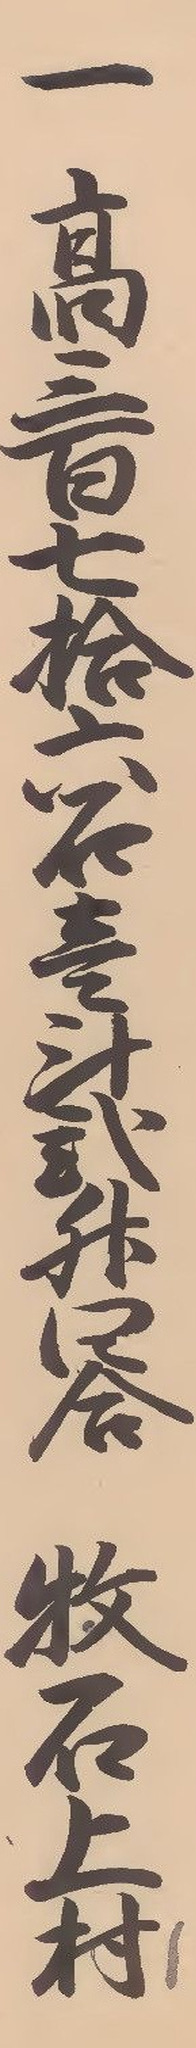一高三百七拾六石壱斗弐升四合牧石上村
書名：淡路国郷帳
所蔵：国立公文書館 National Archives of Japan
